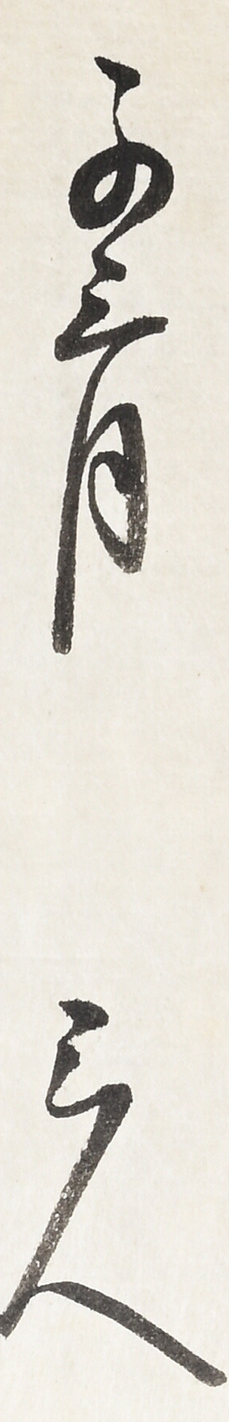子三月三人
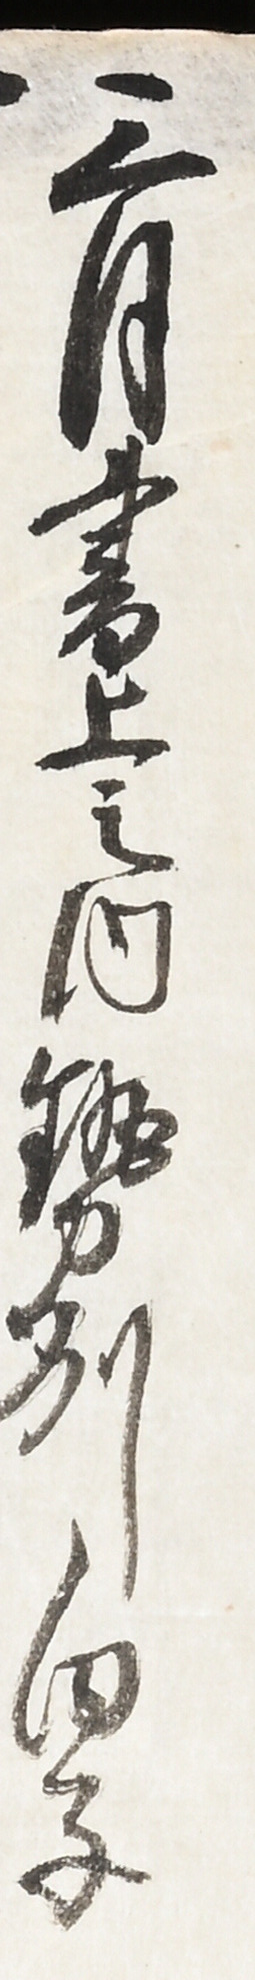三月書上之内勢州白子
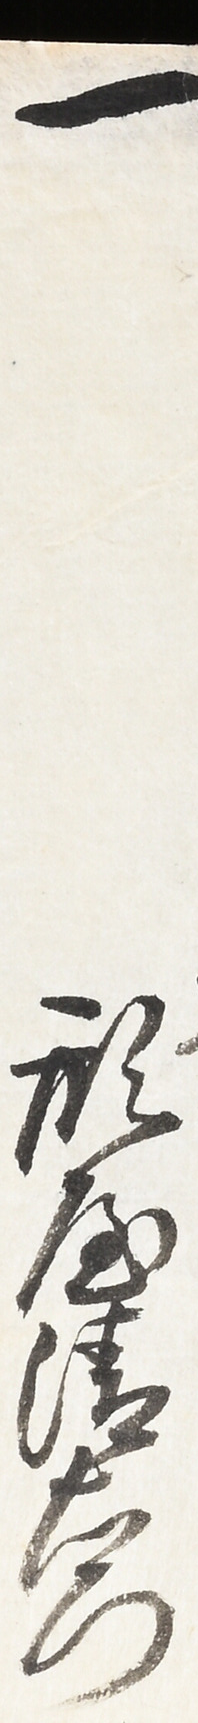一形屋清右衛門
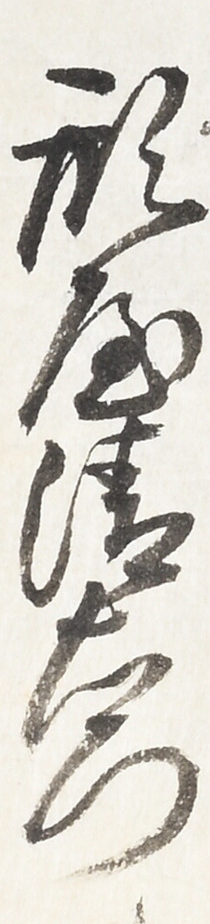一形屋清右衛門
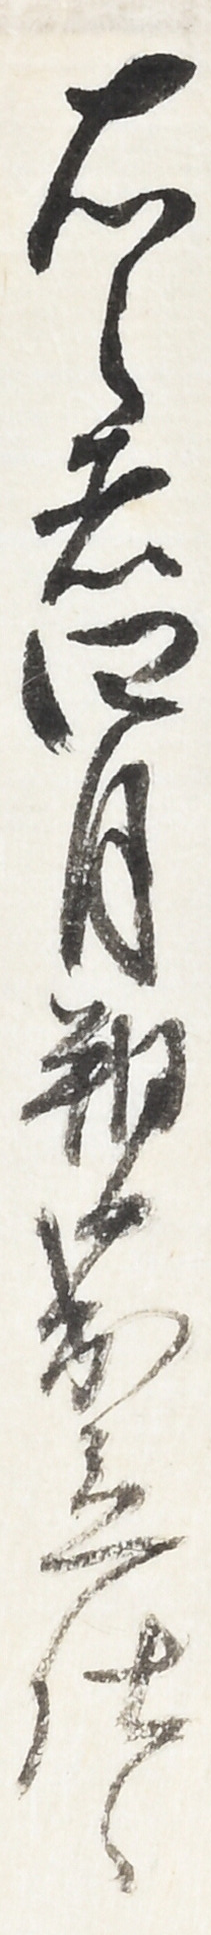右之者四月朔日出立仕候
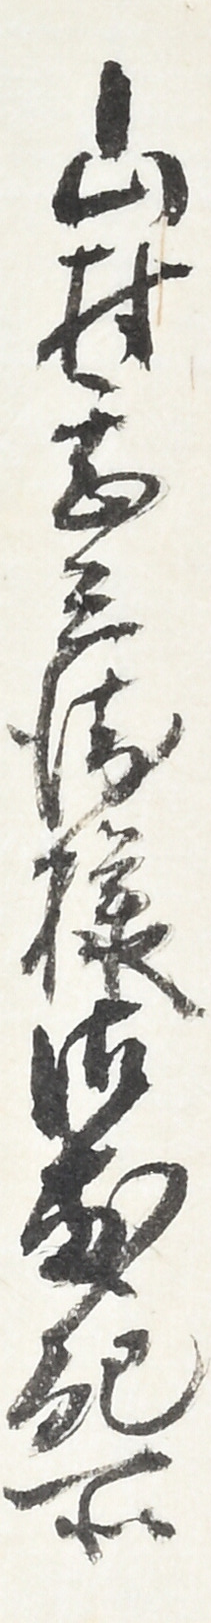山村甚兵衛様御支配所
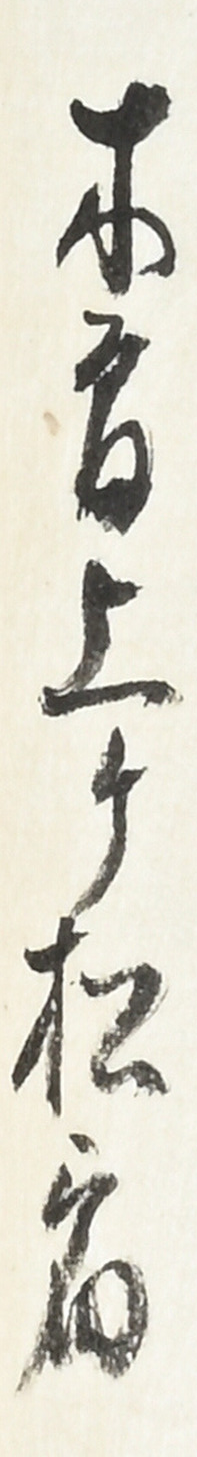木曽上ケ松宿
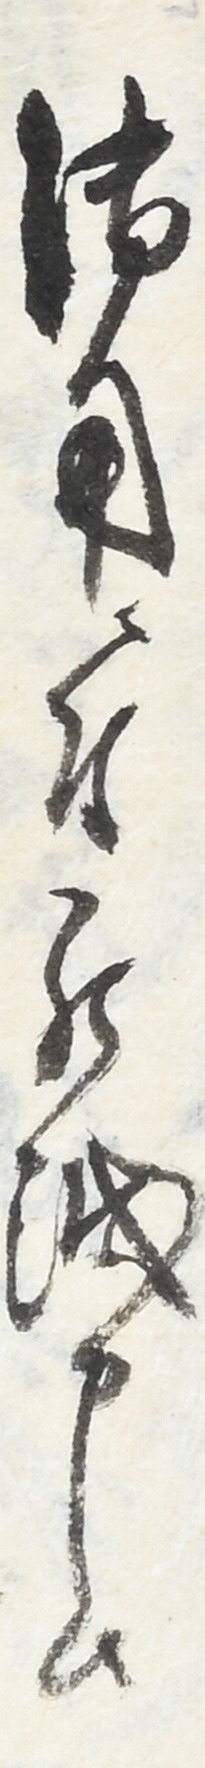御用ニ付罷越申候
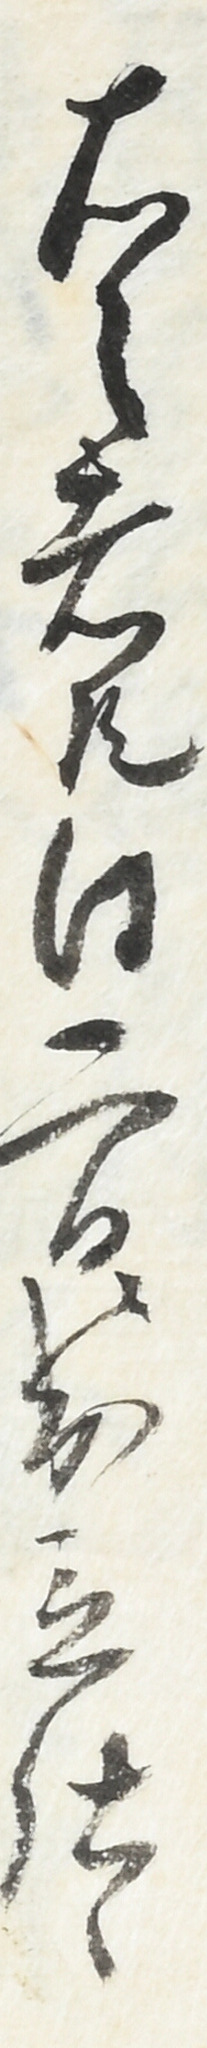右之者同廿六日出立仕候

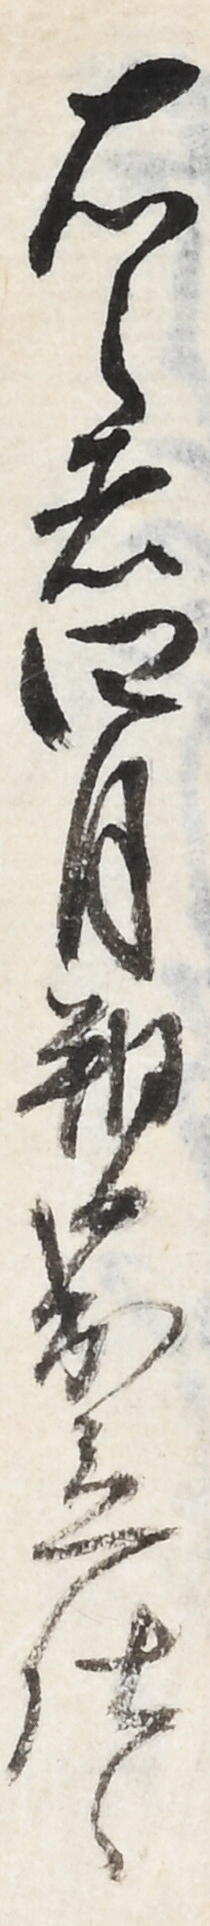右之者同六日出立仕候
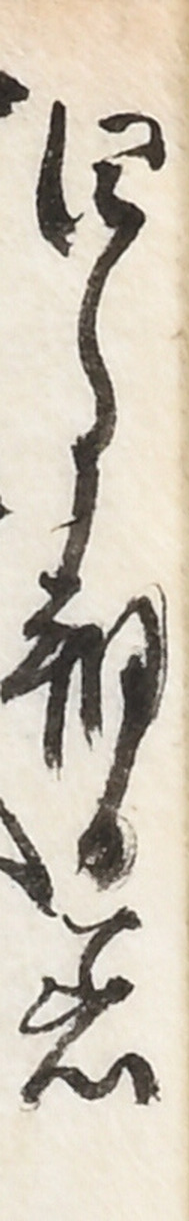四月朔日着
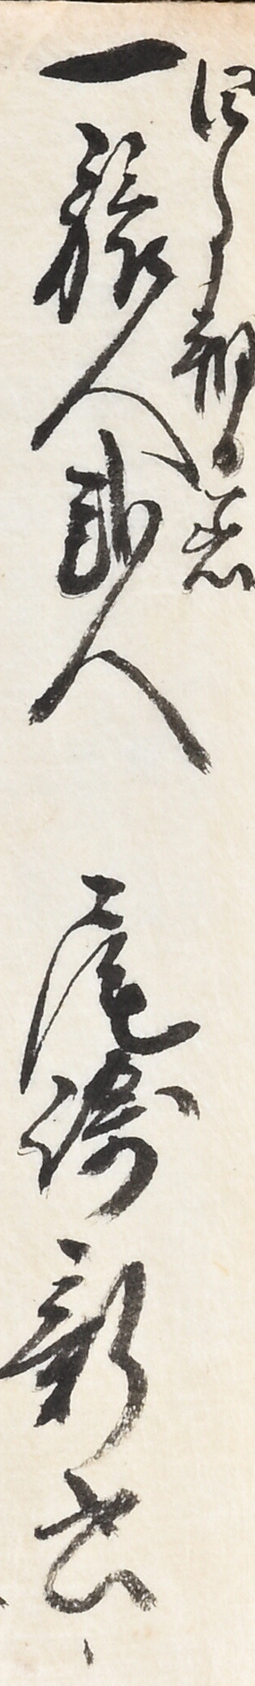一旅人弐人尾崎新六
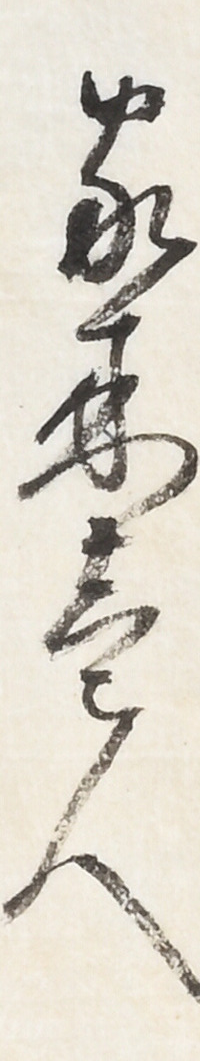家来壱人
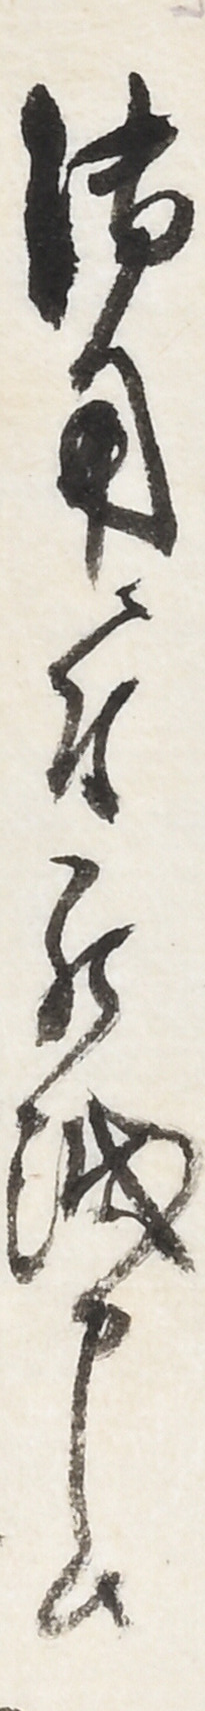御用ニ付罷越申候
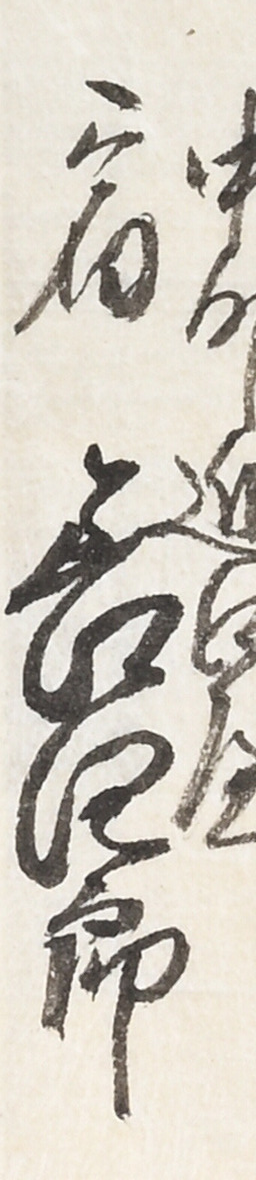宿善四郎
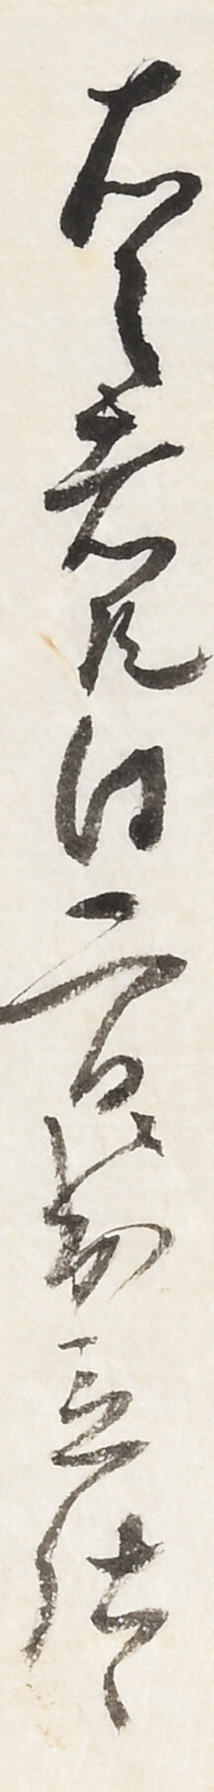右之者共同二日ニ出立仕候
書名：旅人泊控帳
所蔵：伊那市立高遠町図書館・合同会社AMANE
